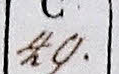49.
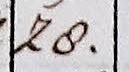28.
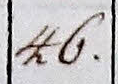46.
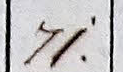71.
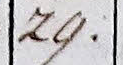29.
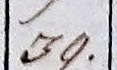39.
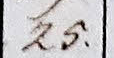25.
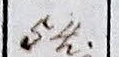54.
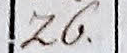26.
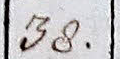38.
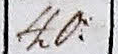40.
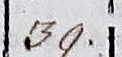39.
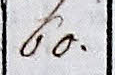60.
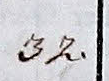32.
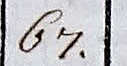67.
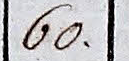60.
